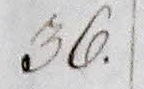36.
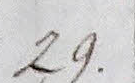29.
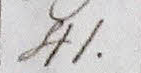41.
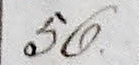56.
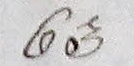63
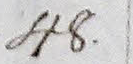48.
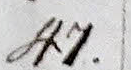47.
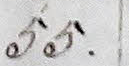55.
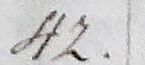42.
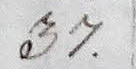37.
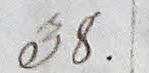38.
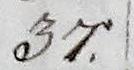37.
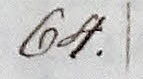64.
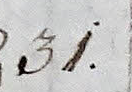31.
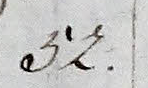52.
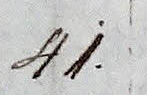41.
